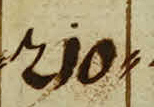210
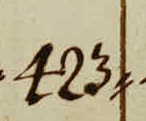423
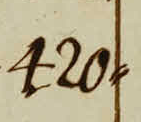420
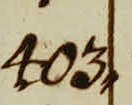403
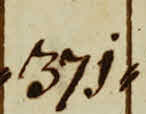371
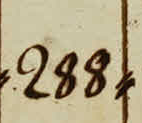288
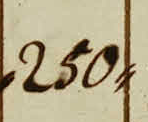250
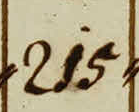215
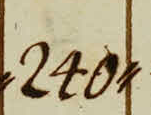240
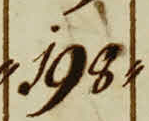198
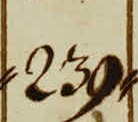239
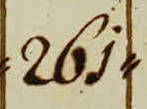261
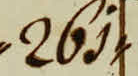261
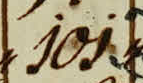101
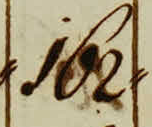162
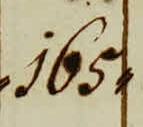165
